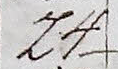24
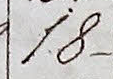18
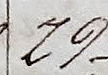29
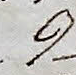9
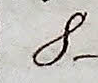8
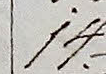14
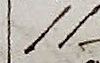11
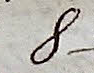8
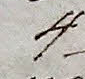4
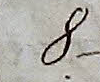8
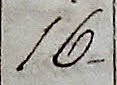16
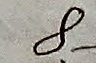8
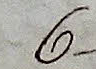6
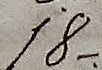18
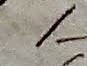1
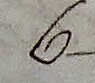6
